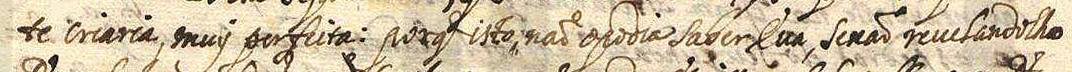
te criaria, muy perfeita: porq̄ isto, naõ o podia saber Eua, senaõ reuelandolho
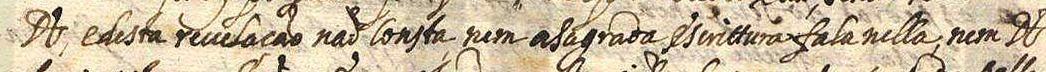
Ds̄, e desta reuelação naõ consta, nem a sagrada escrittura fala nella, nem Ds̄
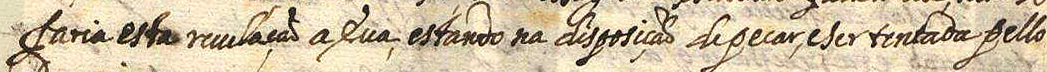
faria esta reuelaçaõ a Eua, estando na disposiçaõ de pecar, e ser tentada pello
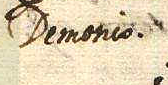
Demonio.
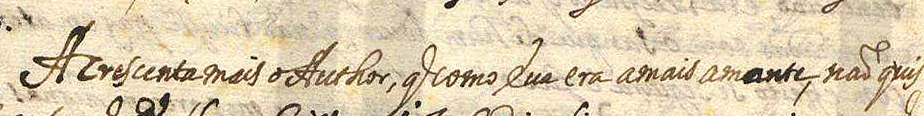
Acrescenta mais o Author, q̄ como Eua era a mais amante, naõ quis
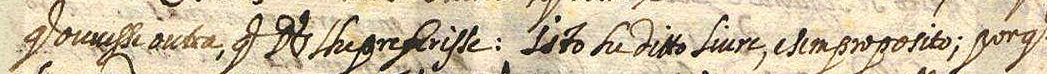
q̄ ouuesse outra, q̄ Ds̄ lhe preferisse: Isto he ditto liure, e sem proposito; porq̄
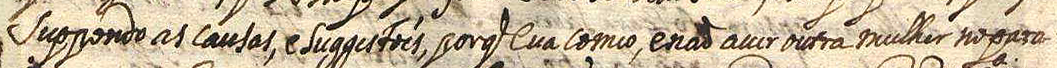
Suppondo as causas, e suggestoẽs, porq̄ Eua comeo, e naõ auer outra mulher no para
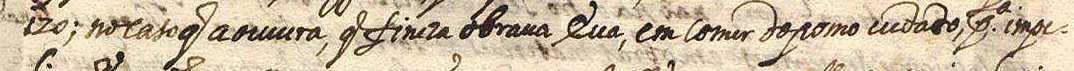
izo; no caso q̄ a ouuira, q̄ fineza obraua Eua, em comer do pomo uedado, p.a impe
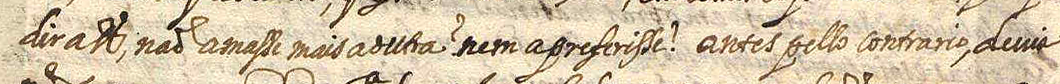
dir a Ds̄, naõ amasse mais a outra? nem a preferisse? antes pello contrario, deuia
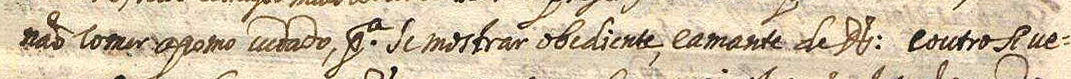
naõ comer o pomo uedado, p.a se mostrar obediente, e amante de Ds̄: e outrosi ue
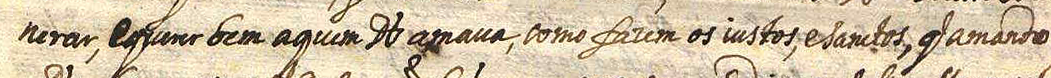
nerar, e querer bem a quem Ds̄ amaua, como fazem os iustos, e sanctos, q̄ amandoo
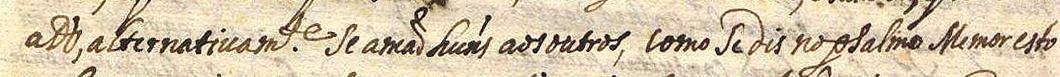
a Ds̄, alternatiuam.te se amaõ hun̄s aos outros, como se dis no pSalmo Memor esto
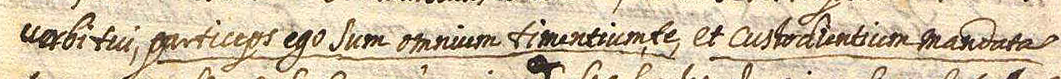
uerbi tui, particeps ego sum omnium timentium te, et custodientium mandata
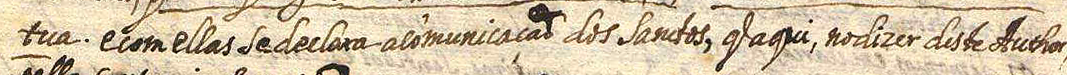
tua; e com ellas se declara a comunicaçaõ dos Sanctos, q̄ aqui, no dizer deste Author
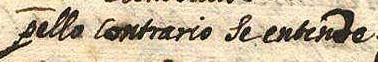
pello contrario se entende.
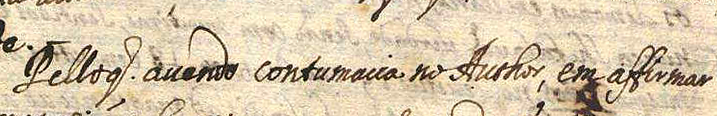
Pello q̄ auendo contumacia no Author, em affirmar
